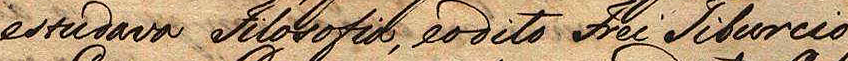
estudava Filosofia, e o dito Frei Tiburcio
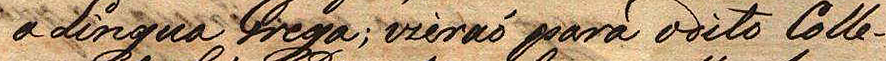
a Lingua Grega; vieraõ para o dito Colle
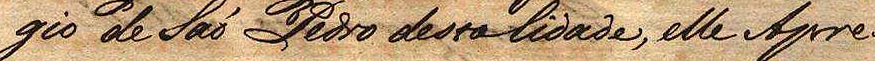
gio de Saõ Pedro dessa Cidade, elle Apre
